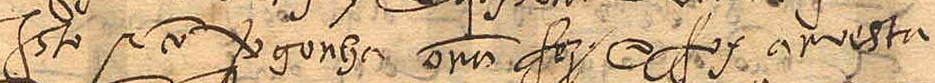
Jsto e cō ꝟgonha o n̄a fez ./ e foy amoesta
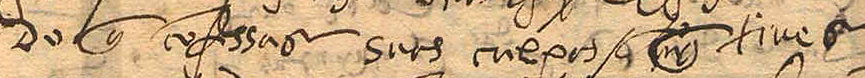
Do q̄ confessase suas culpas / q̄ tiuese
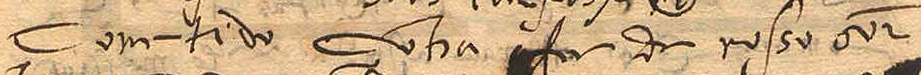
Cometido Cōtra a fee de nosso s̄or
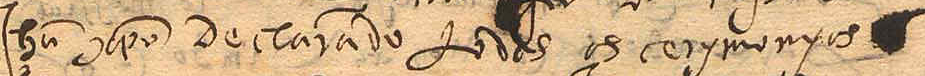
Jhū x̄po Declarādo todas as cerymonyas
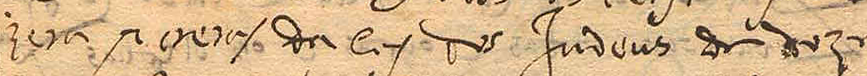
fizera e crera / da ley dos Judeus de doze
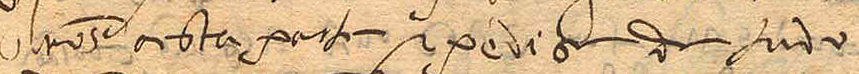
An̄os a esta parte e pedise de tudo
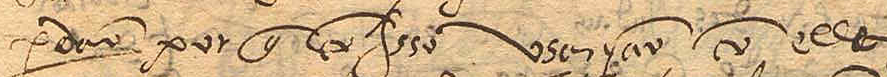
ꝑdaõ porq̄ cō Jsso vsaryão cō elle
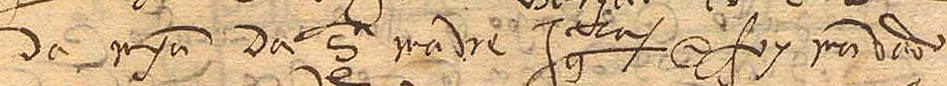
da mȳa Da Sta madre Jgra / e foy mādado
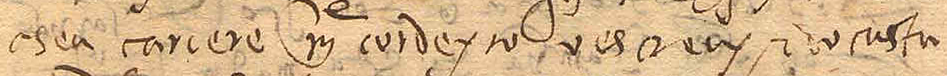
a seu carcere mel cordeyro o escreuy e ao custu
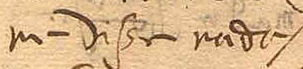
me disse nada /
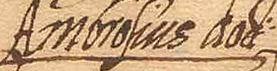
Ambrosius doct̄
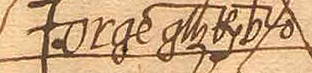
Jorge ḡllz Rybro
